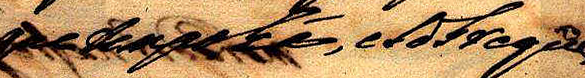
que tempo há, e sobre que
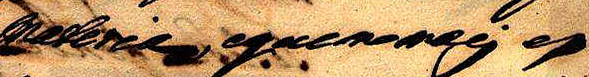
materia, e quem mais es
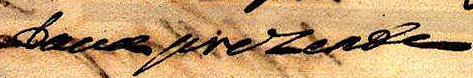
taua prezente
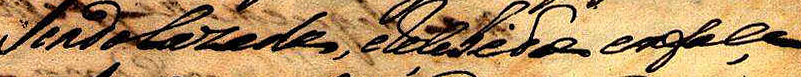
sendo Cazada, e ReÇebida em faÇe
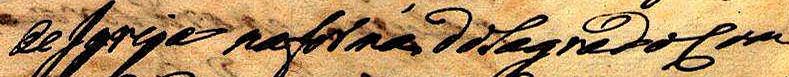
de Jgreja na forma do Sagrado Com
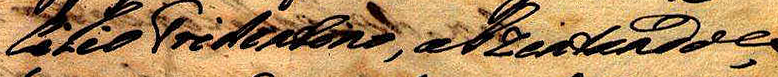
ÇiLio Tridentino, abzentrandoce
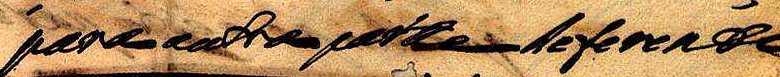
para outra parte deferente
